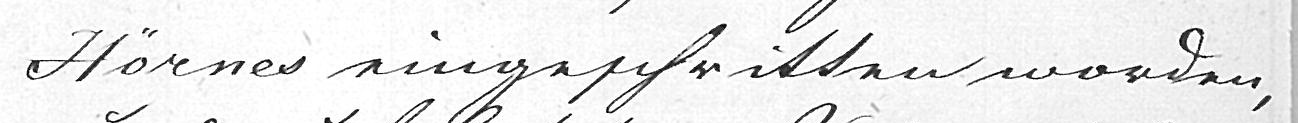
Hörnes eingeschritten worden
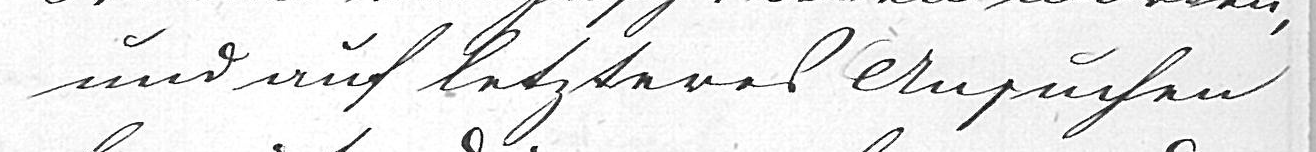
und auf letzteres Ansuchen
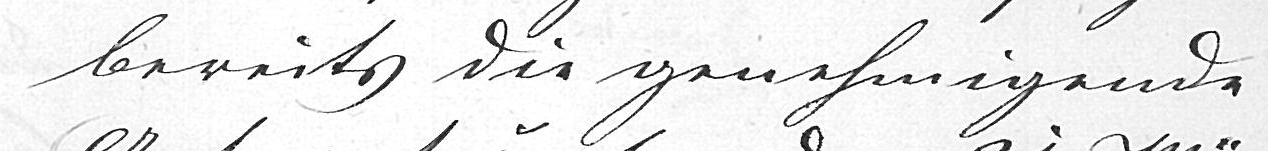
bereits die genehmigende
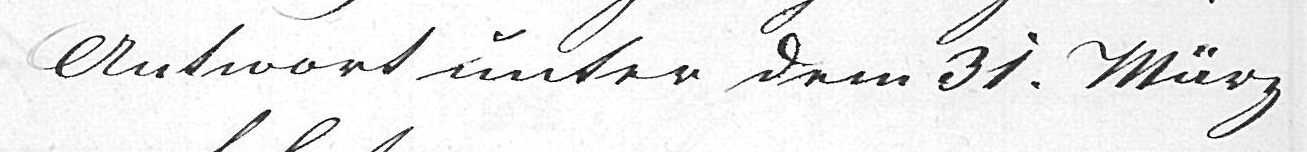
Antwort unter dem 31. März
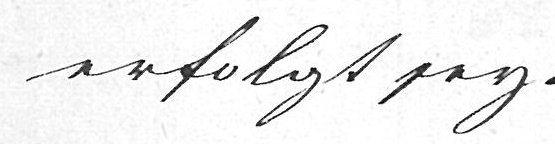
erfolgt sey.
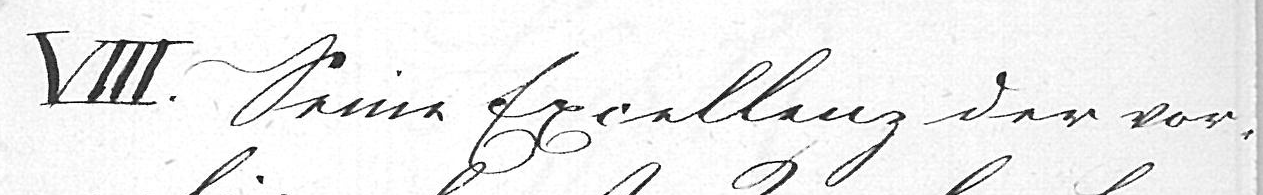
VIII. Seine Excellenz der vor-
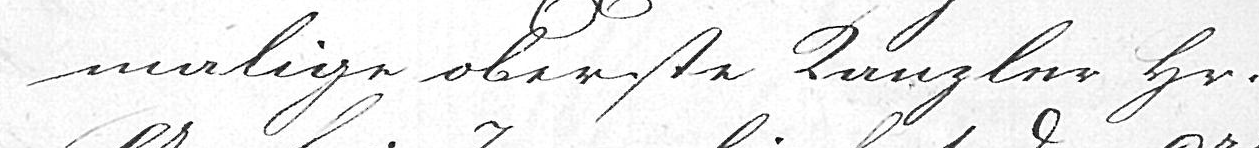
malige oberste Kanzler Hr.
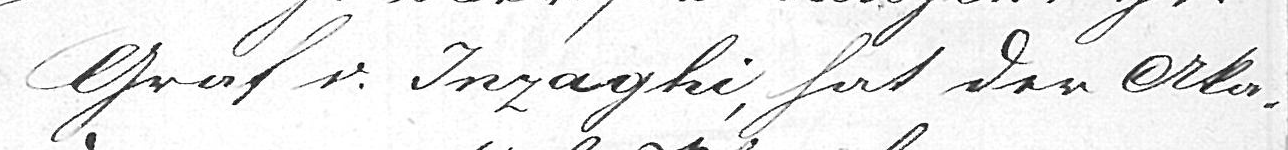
Graf v. Inzaghi, hat der Aka--
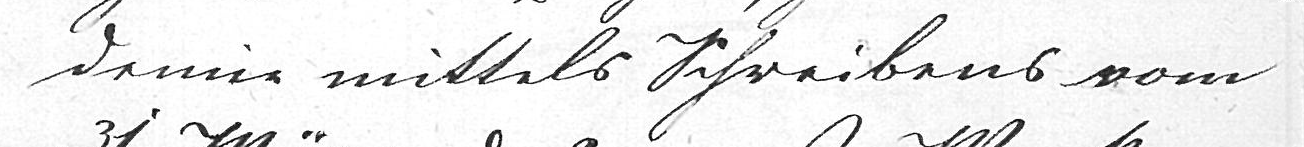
demie mittels Schreibens vom
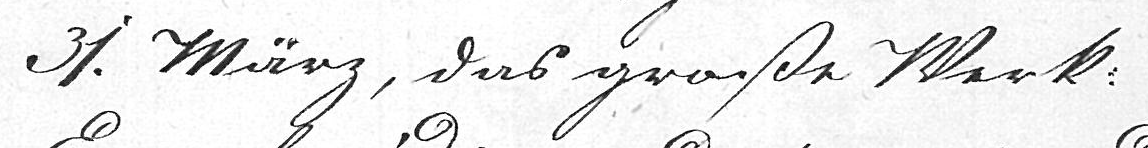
31. März das große Werk:
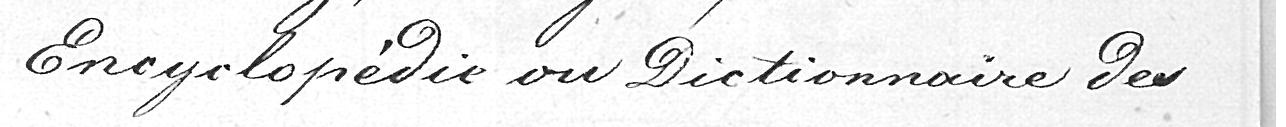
Encyclopédie ou Dictionnaire des
